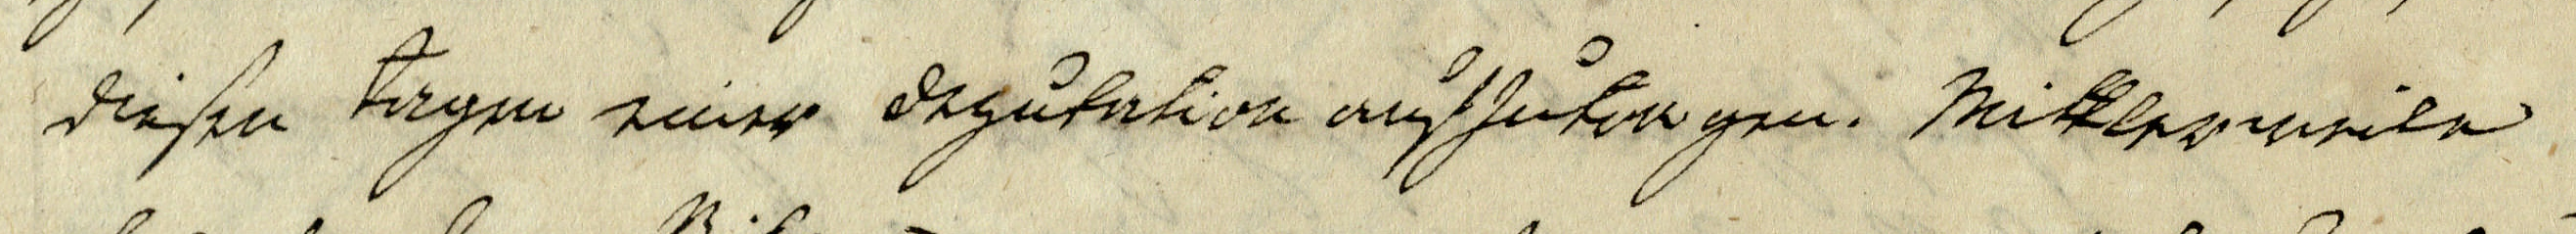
diesen Tagen einer Deputation aufzutragen. Mittlerweile
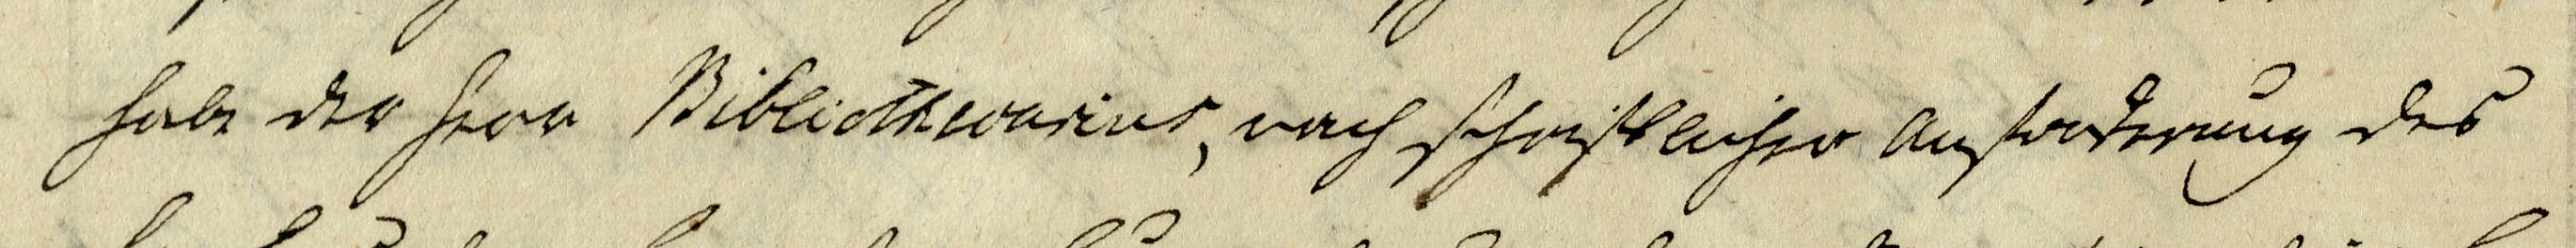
habe der Herr Bibliothecarius, nach schriftlicher Anforderung des
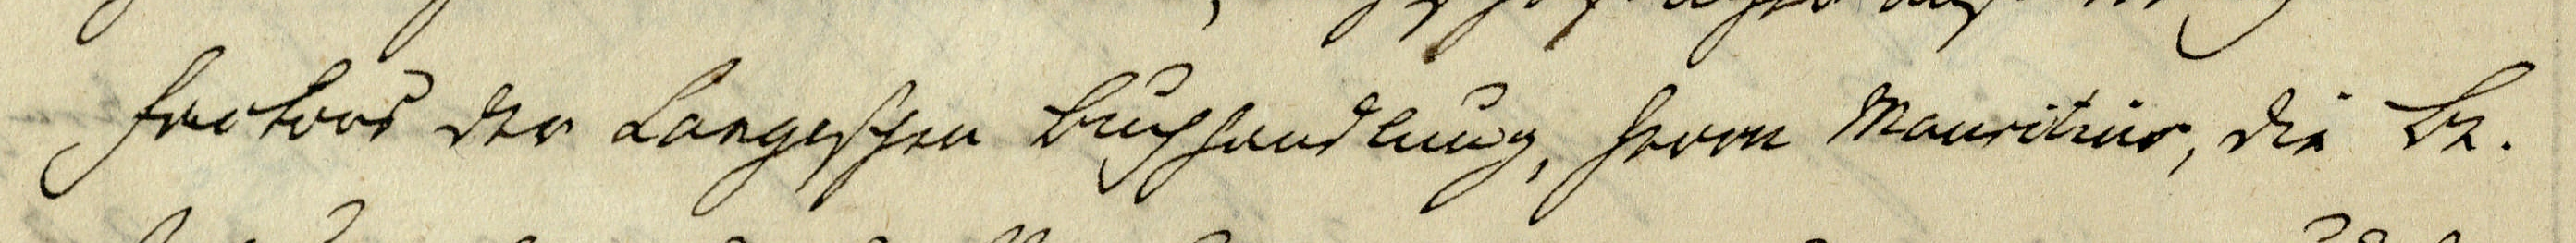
Factors der Langeschen Buchhandlung, Herrn Mauritius, die Be¬
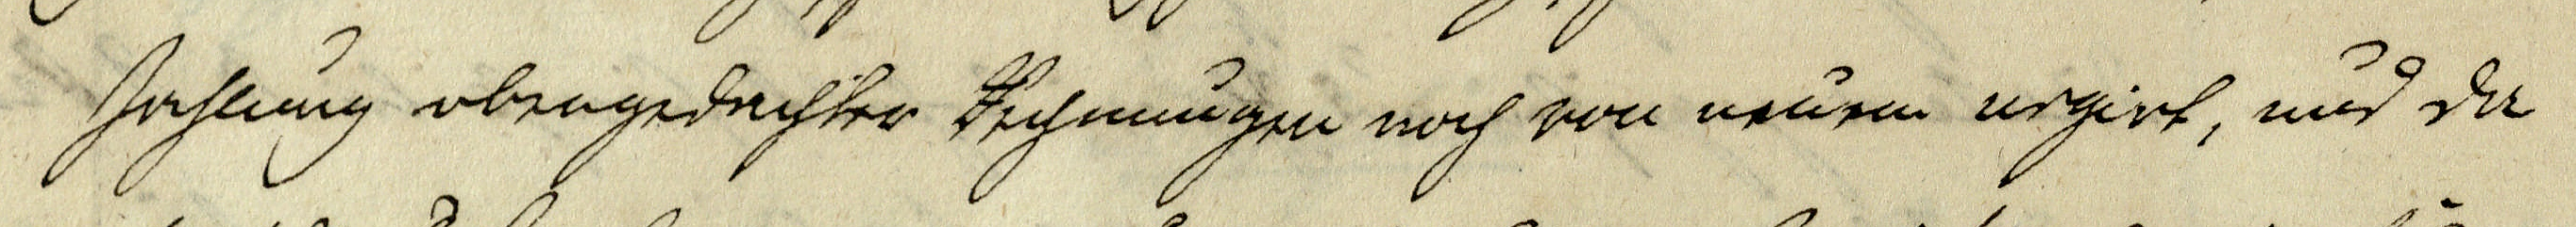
zahlung obengedachter Rechnungen noch von neuem urgirt, und da
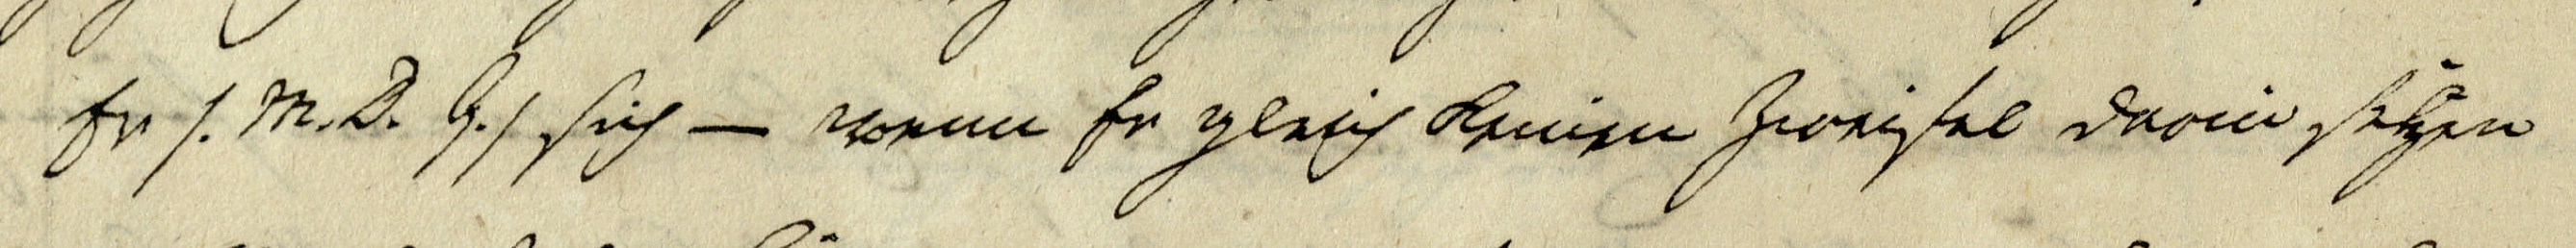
Er /. M. D. R. / sich - wenn Er gleich keinen Zweifel darin setzen
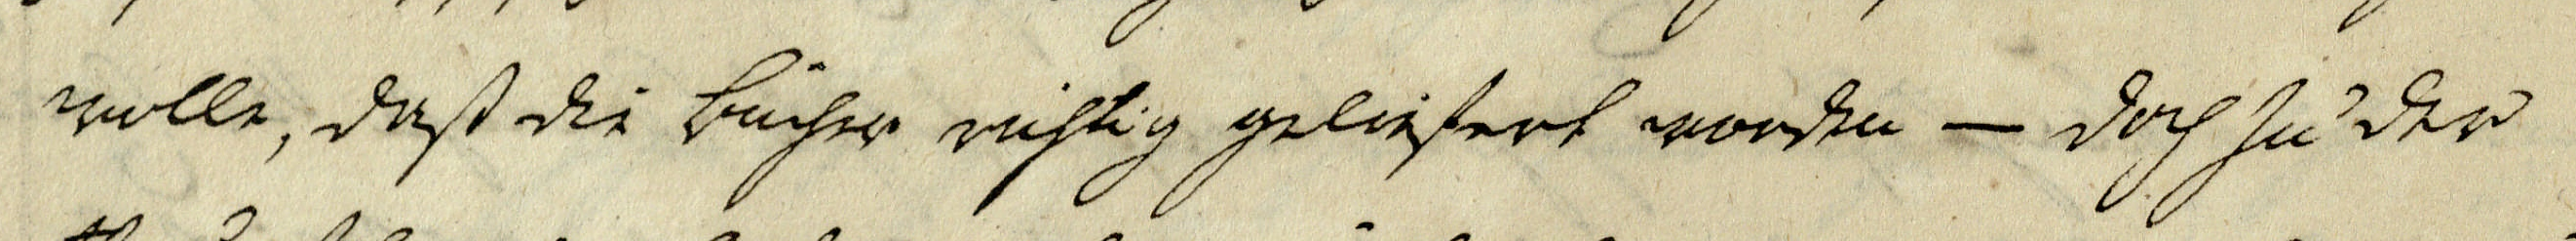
wolle, daß die Bücher richtig geliefert worden - doch zu der
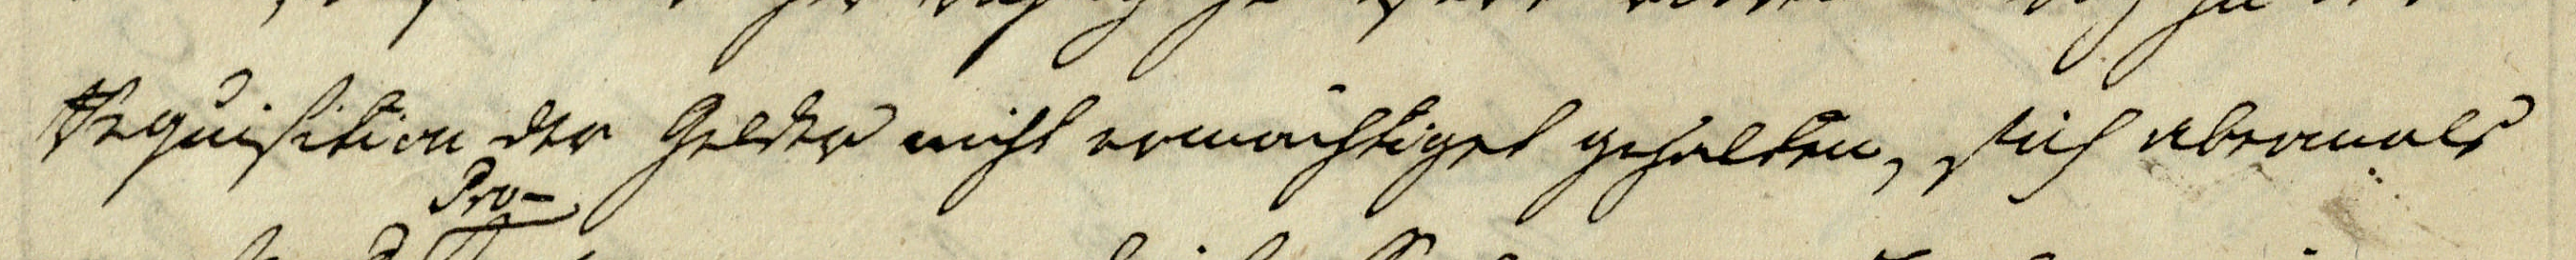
Requisition der Gelder nicht ermächtiget gehalten, sich abermals
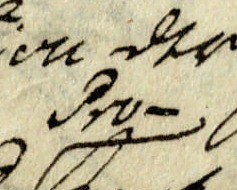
Pro
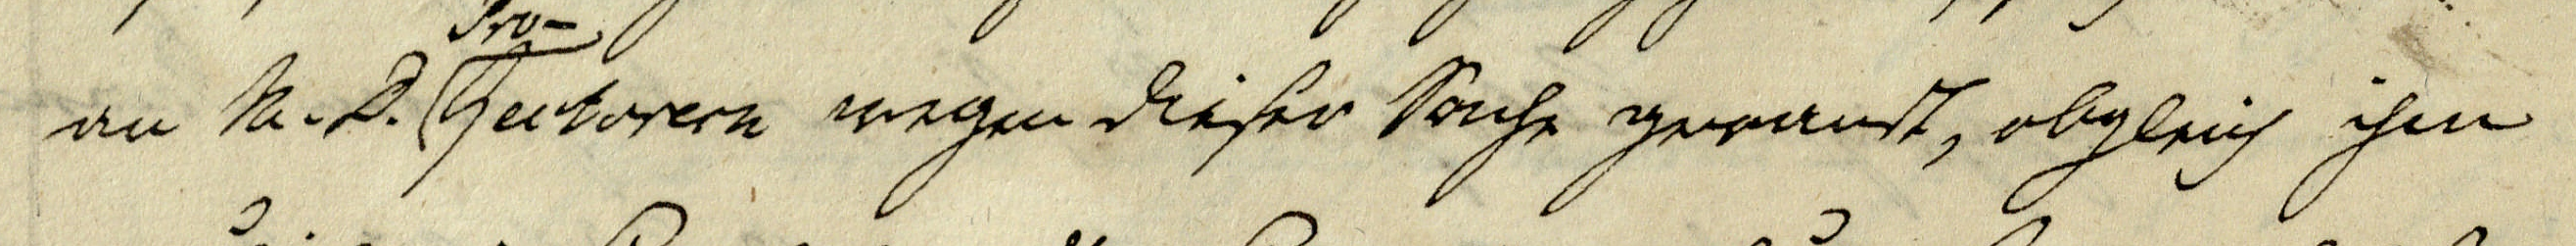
an M. D. Rectorem wegen dieser Sache gewandt, obgleich ihm
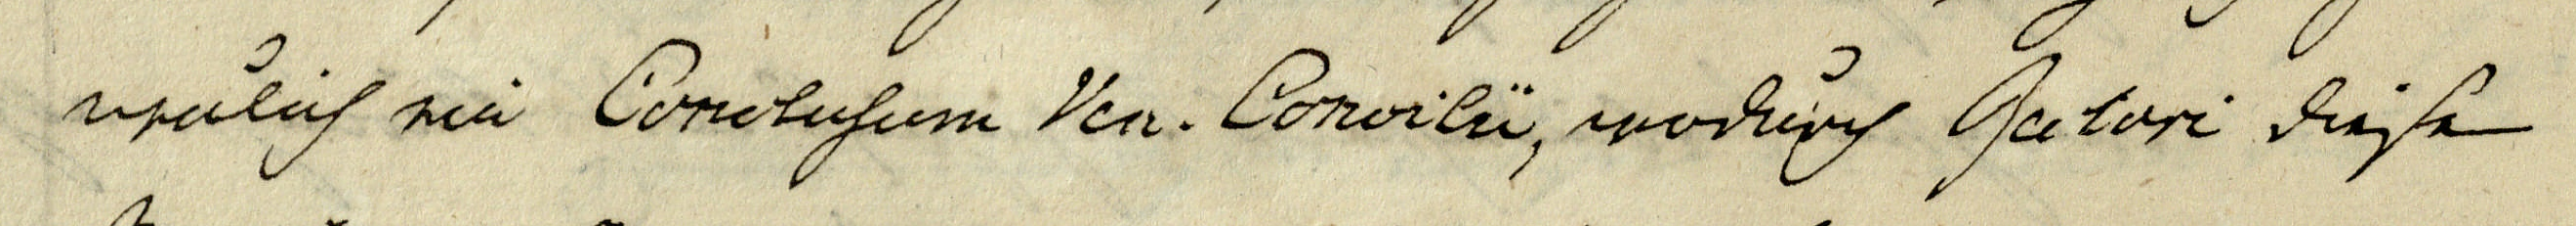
neulich ein Conclusum Ven. Concilii, wodurch Rectori diese
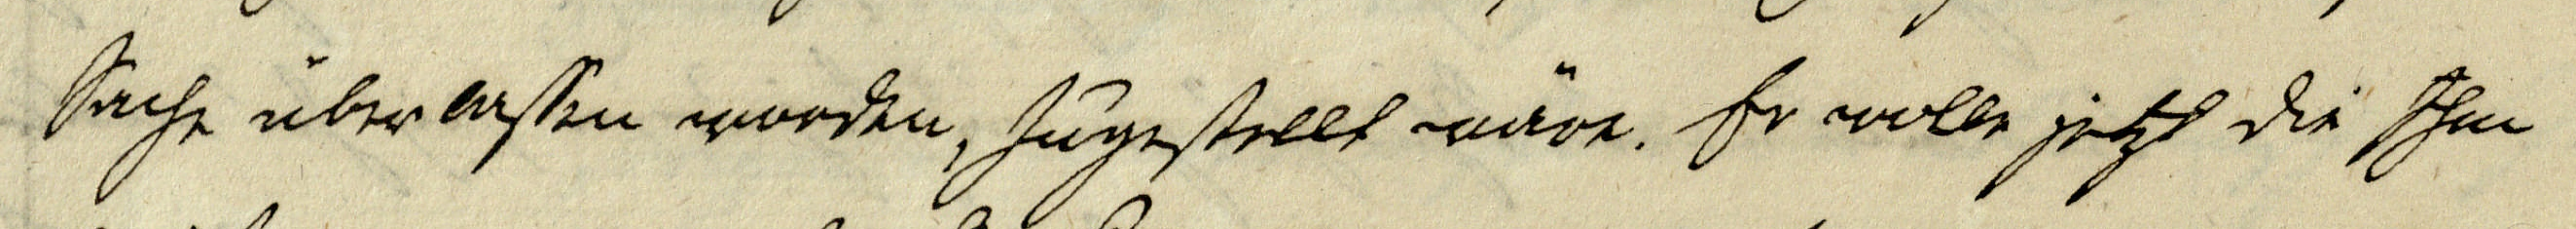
Sache überlassen worden, zugestellt wäre. Er wolle jetzt die Ihm
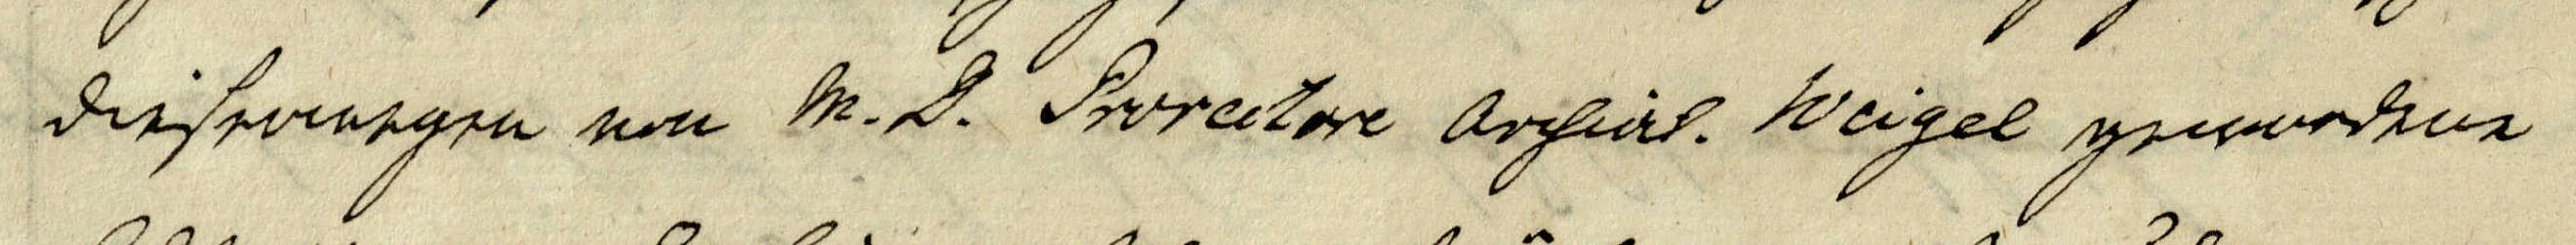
dieserwegen von M. D. Prorectore Archiat. Weigel gewordene
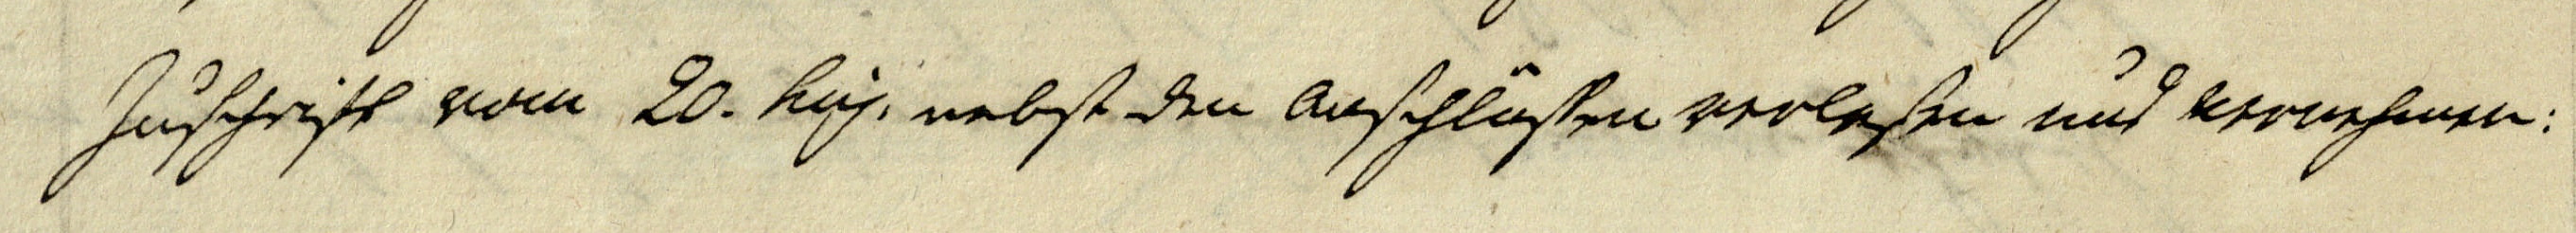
Zuschrift vom 20. huj. nebst den Anschlüssen verlesen und vernehmen:
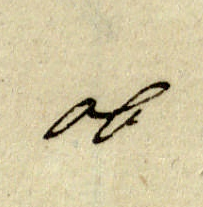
ob
